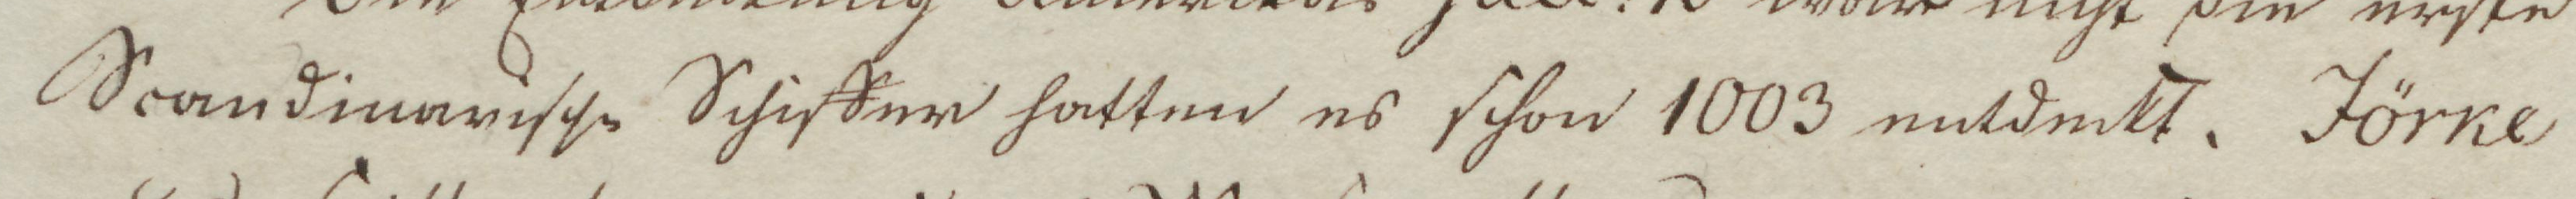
Scandinavische Schiffer hatten es schon 1003 entdeckt. Jörke
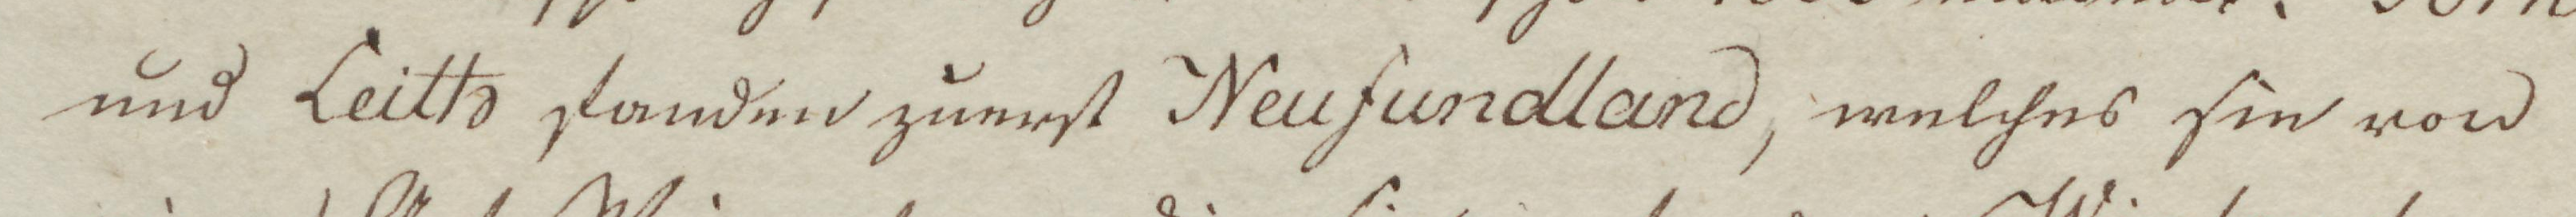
und Leith fanden zuerst Neufundland, welches sie von
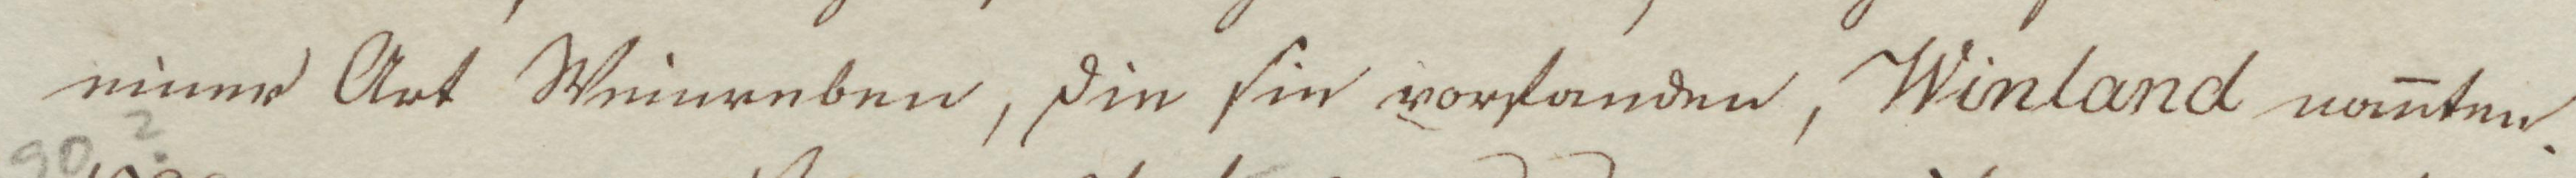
einer Art Weinreben, die sie vorfanden, Winland nañten.
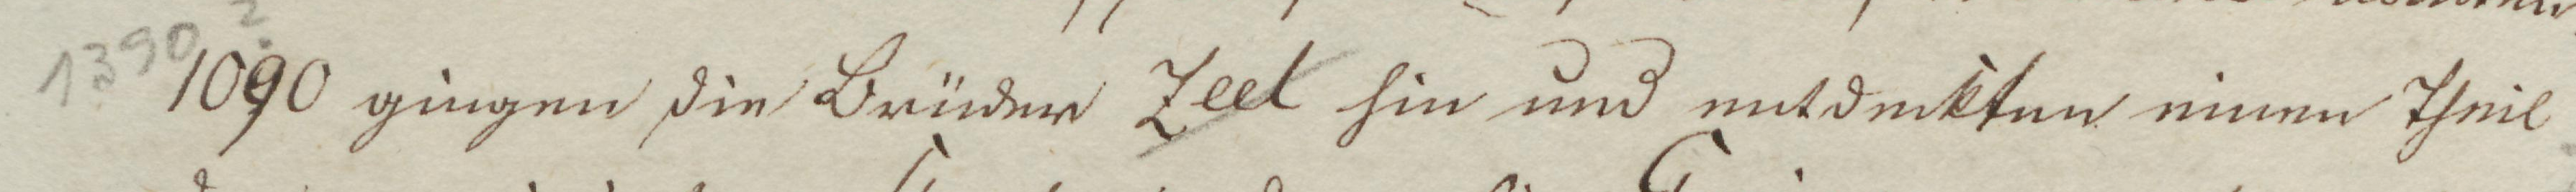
1090 gingen die Brüder ZeelZeen hin und entdeckten einen Theil
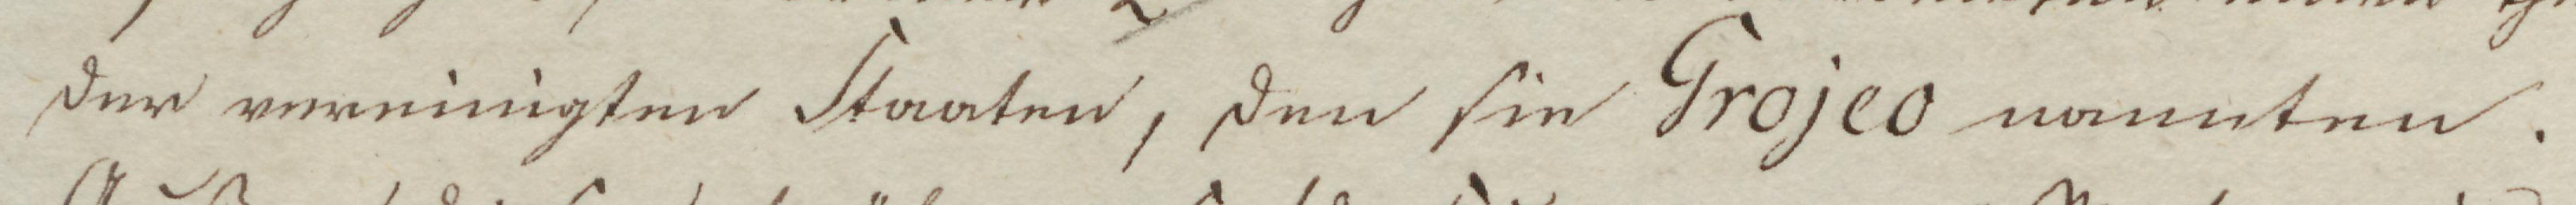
der vereinigten Staaten, den sie Grojeo nannten.
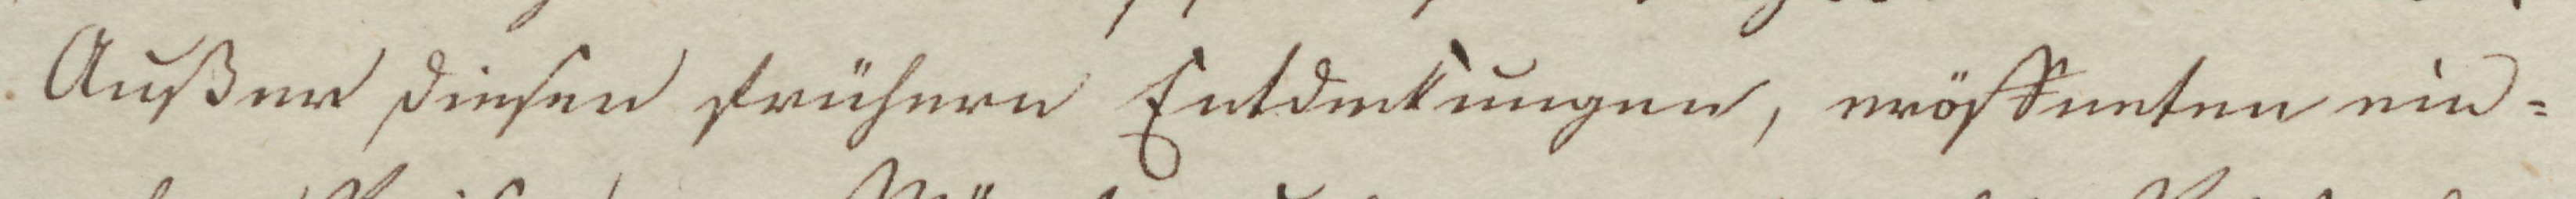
Außer diesen frühern Entdeckungen, eröffneten ein-
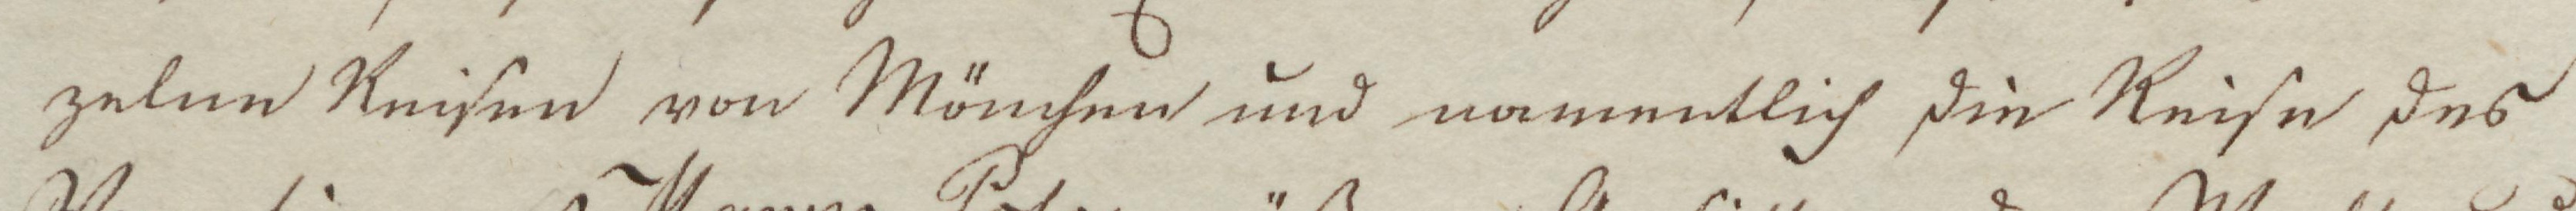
zelne Reisen von Mönchen und namentlich die Reise des
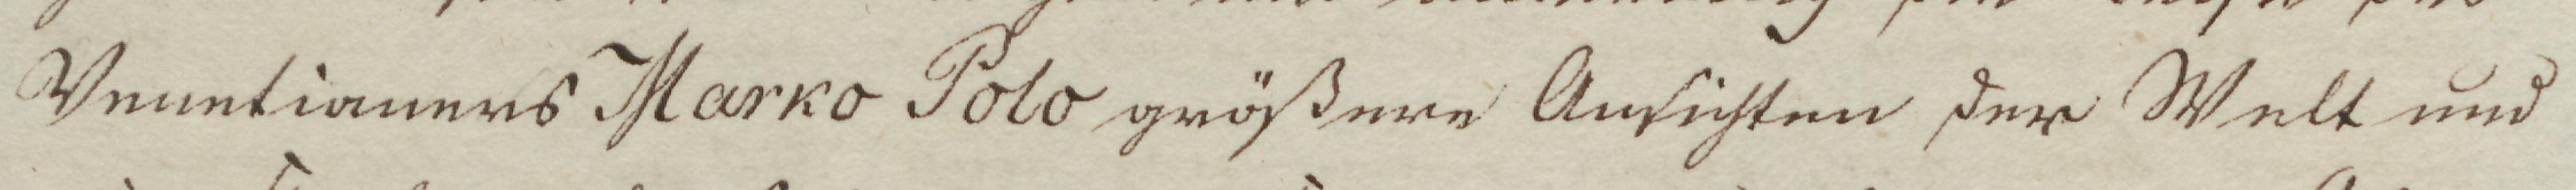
Venetianers Marko Polo größere Ansichten der Welt und
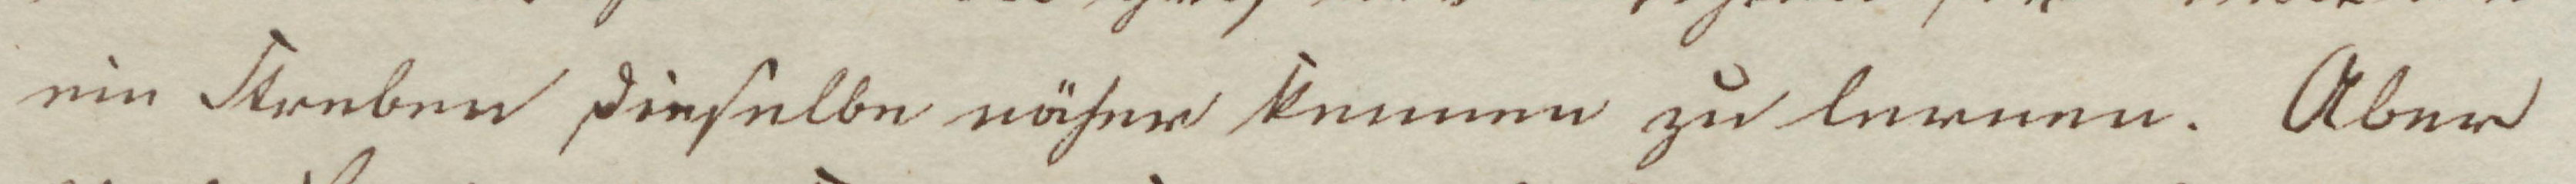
ein Streben dieselbe näher kennen zu lernen. Aber
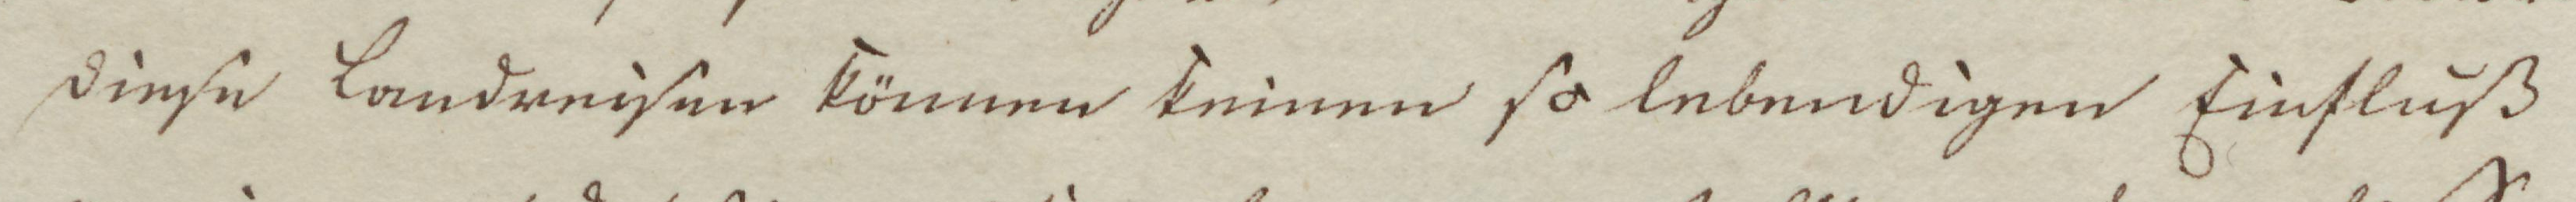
diese Landreisen können keinen so lebendigen Einfluß
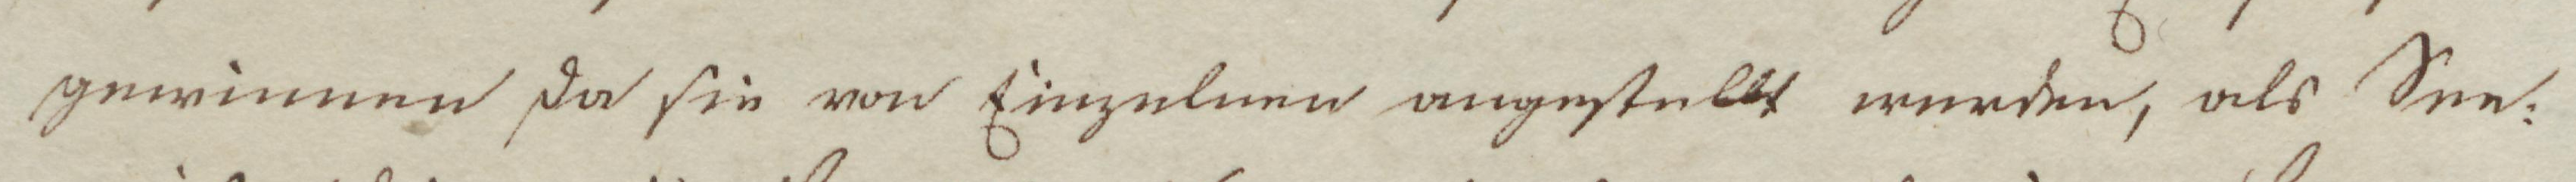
gewinnen da sie von Einzelnen angestellt wurden, als See-
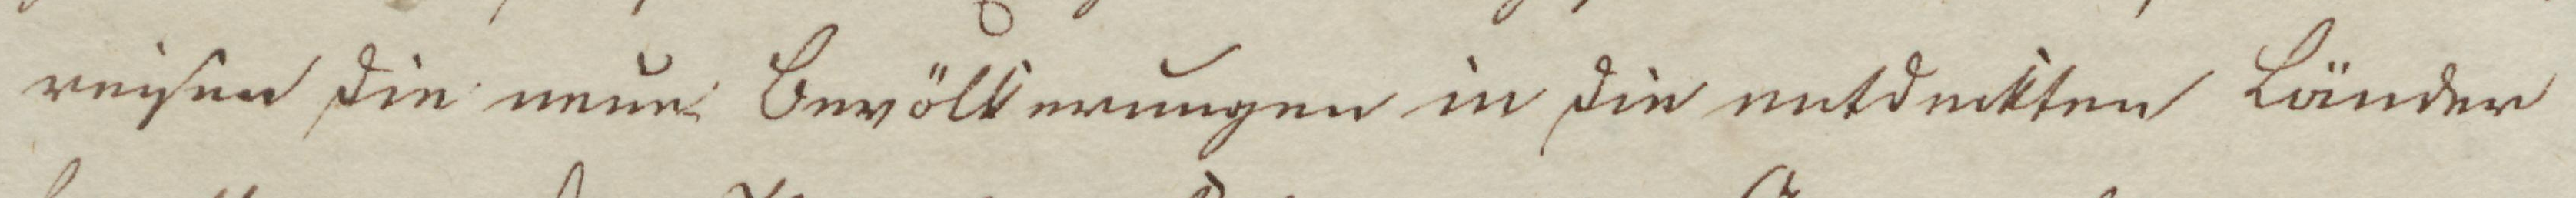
reisen die neue Bevölkerungen in die entdeckten Länder
